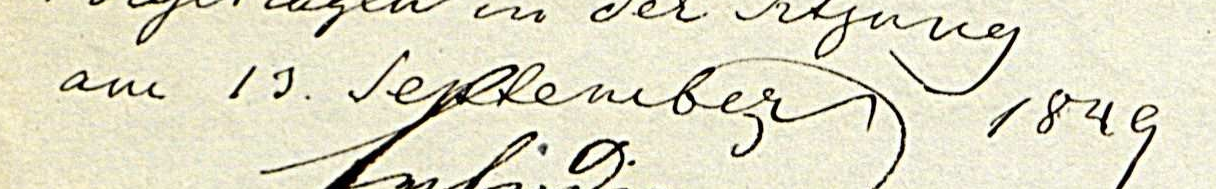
am 13. September 1849
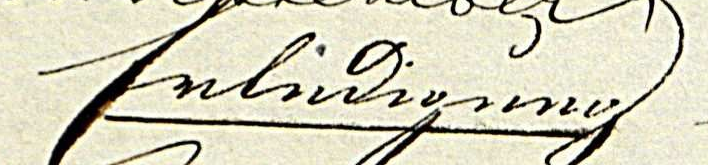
Erledigung
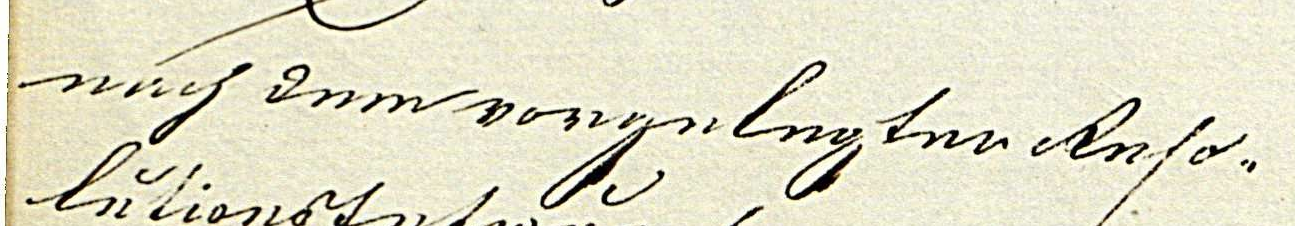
Nach dem vorgelegten Reso¬
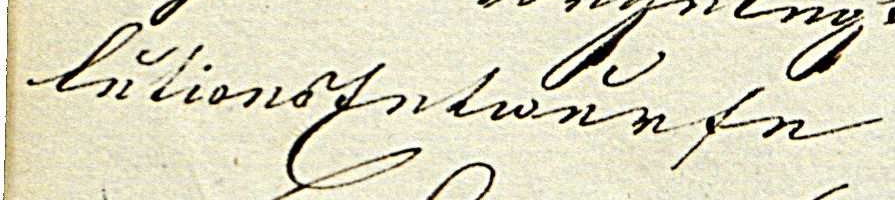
lutionsentwurfe
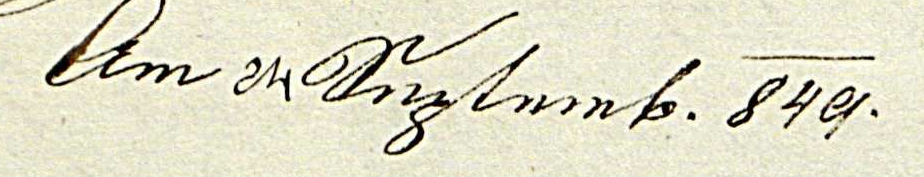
Am 24. Septemb. 849
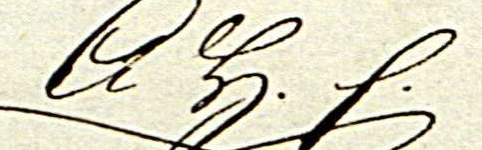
AH E
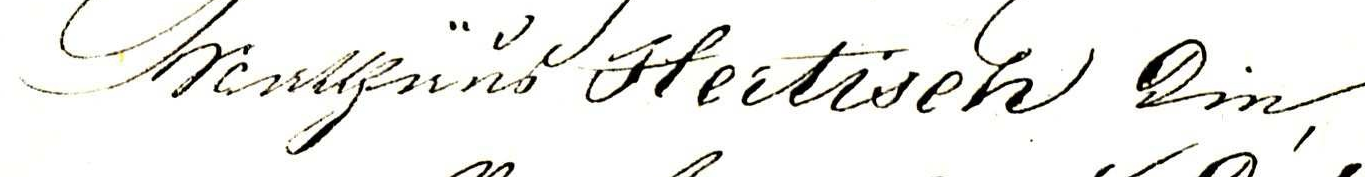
Matthäus Hertisch die
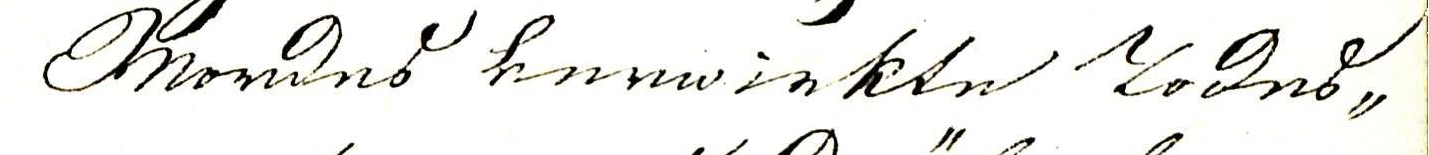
Mordes verwirkte Todes¬
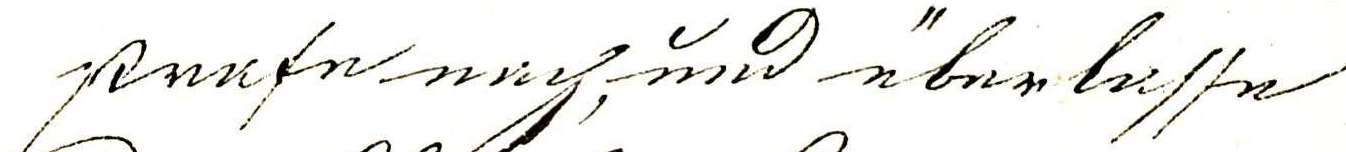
strafe nach, und überlasse
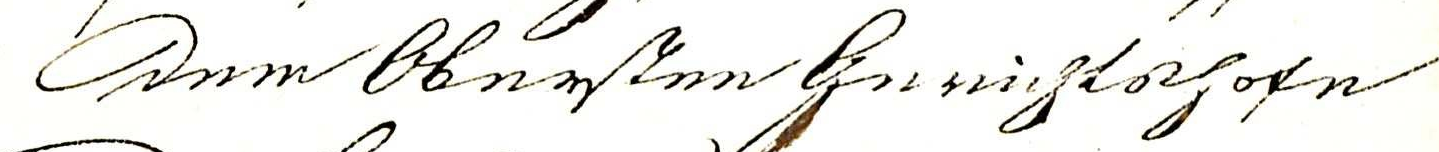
dem Obersten Gerichtshofe die
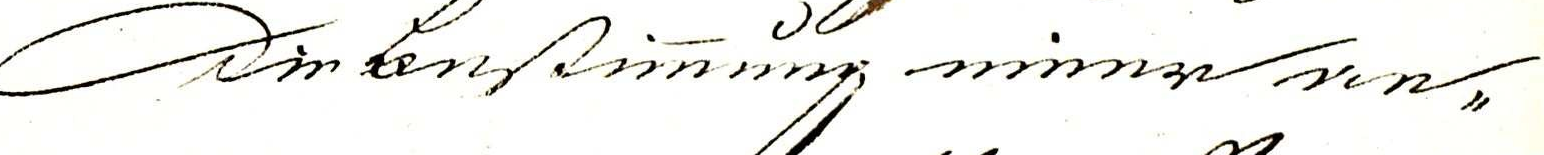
Bestimmung einer an¬
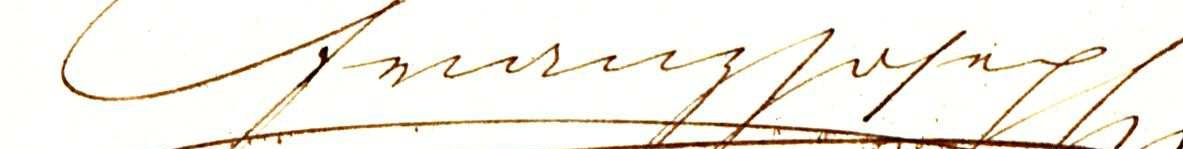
Franz Joseph
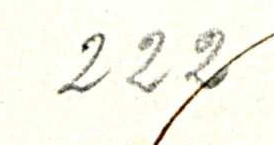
222
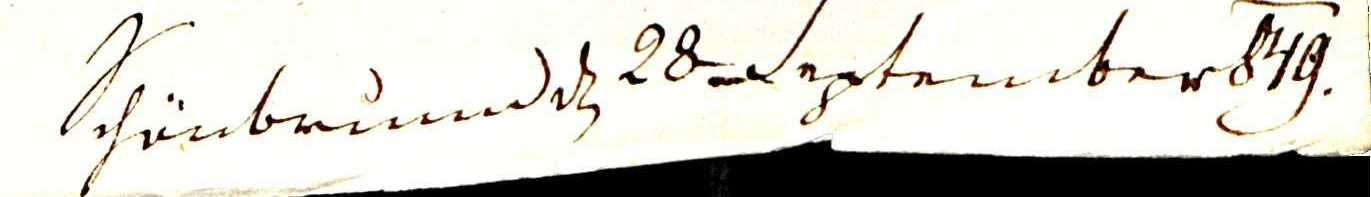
Schönbrunn, 28. September 1849
